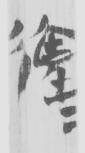{彳卣壬}=
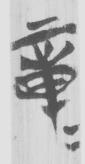章=
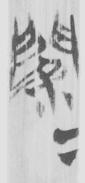{門豕}=
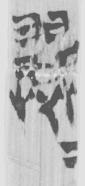翼=
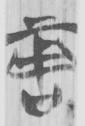{巫口}
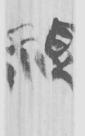視
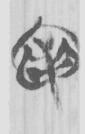龜
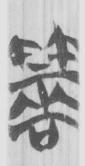{筮口}
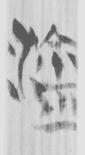淦
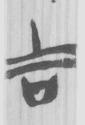吉
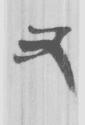又
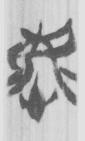慶
